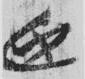臣
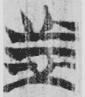者
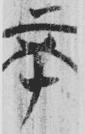不
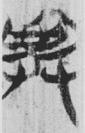與
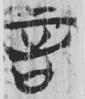言
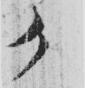人
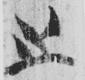之
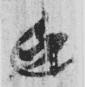臣
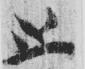之
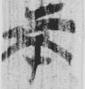不
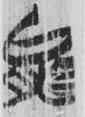能
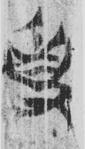事
